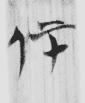住
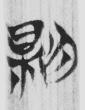則
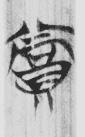賞
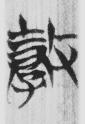{㱿子}
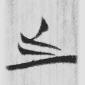之
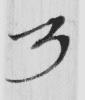乃
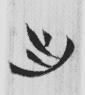出
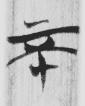不
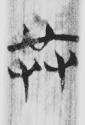共
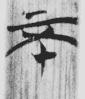不
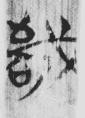{苟戈}
